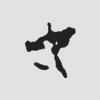女
